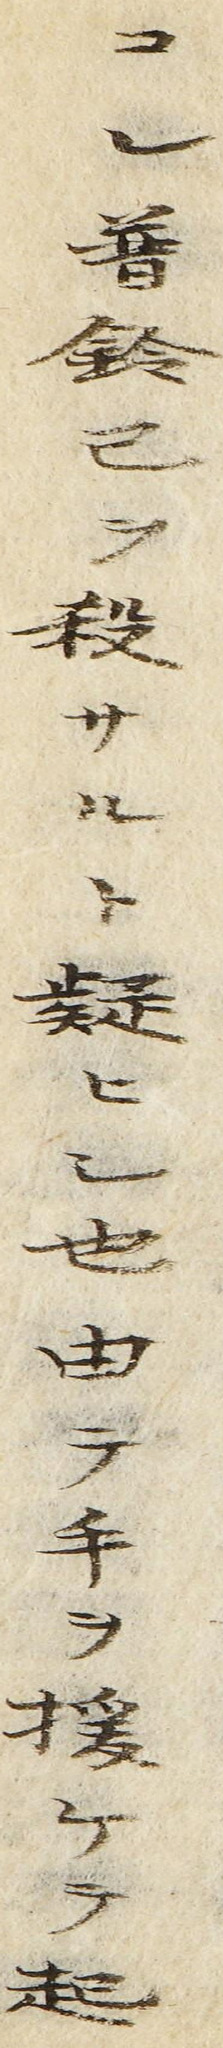コレ普鈴己ヲ殺サルト疑ヒシ也由テ手ヲ援ケテ起

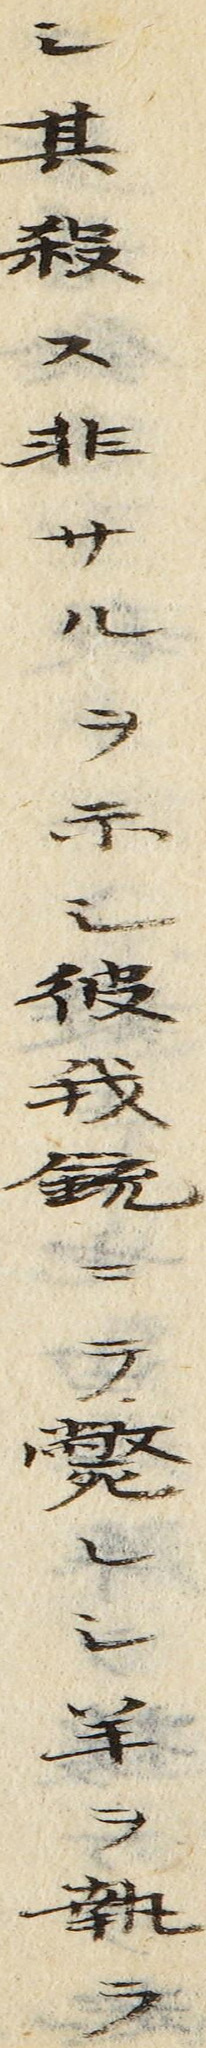シ其殺ス非サルヲ示シ彼我銃ニテ斃レシ羊ヲ執ラ
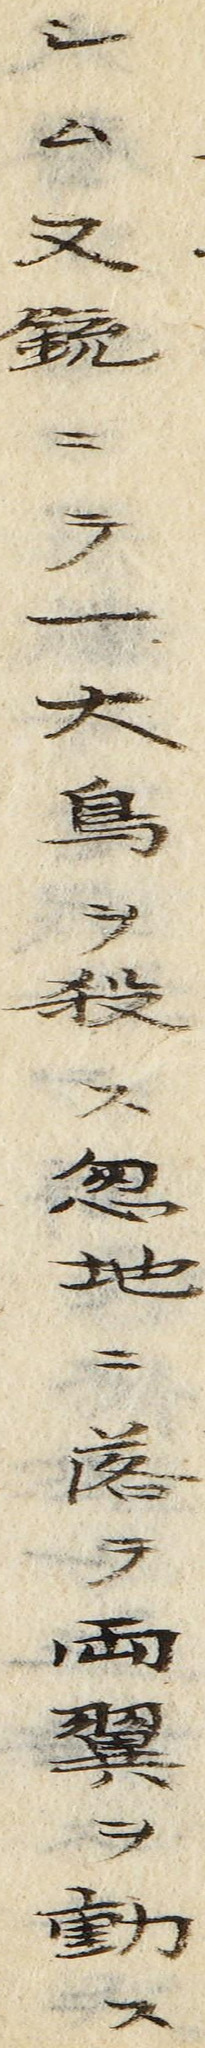シム又銃ニテ一大鳥ヲ殺ス忽地ニ落テ両翼ヲ動ス
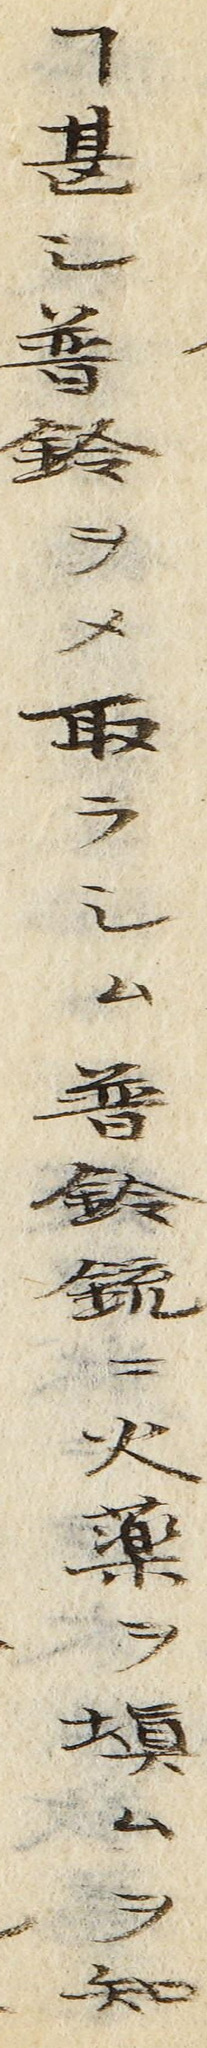コト甚シ普鈴ヲシテ取ラシム普鈴銃ニ火薬ヲ填ムヲ知
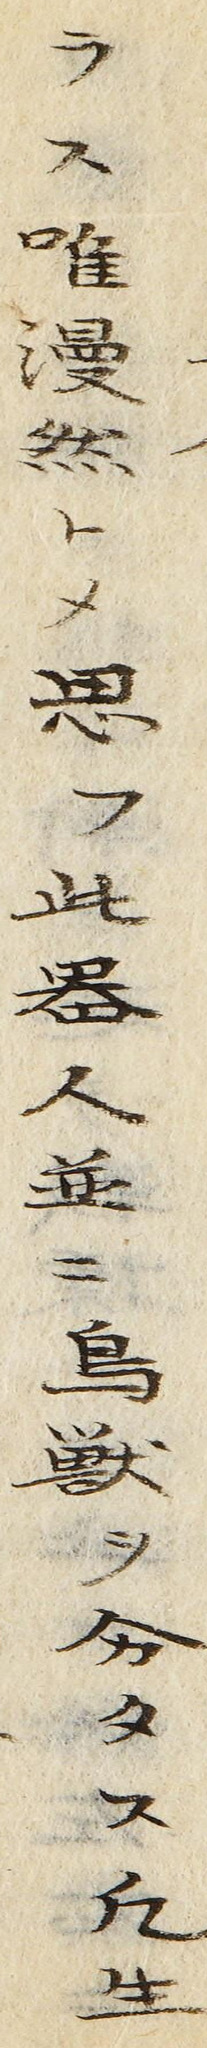ラス唯漫然トシテ思フ此器人並ニ鳥獣ヲ分タス凡生
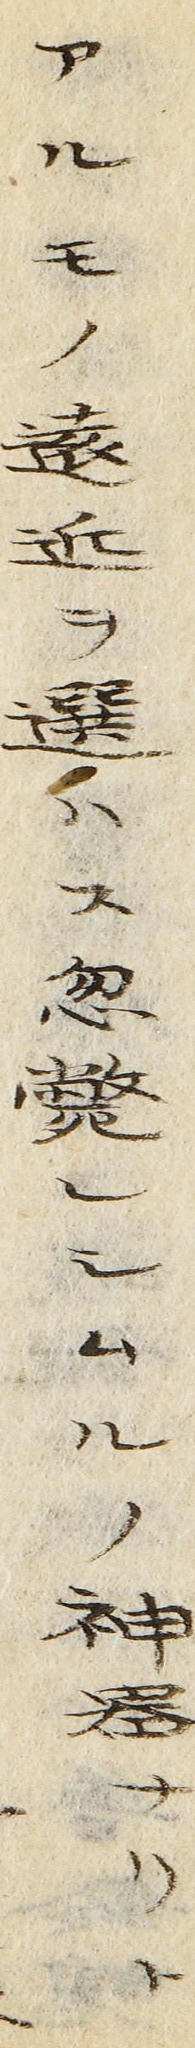アルモノ遠近ヲ選ハス忽斃レシムルノ神器ナリト
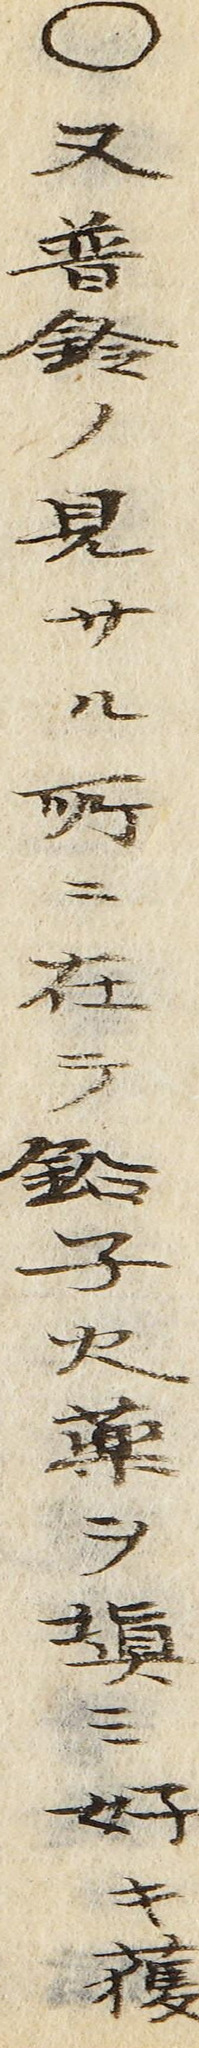◯又普鈴ノ見サル所ニ在テ鉛子火薬ヲ填ミ好キ獲
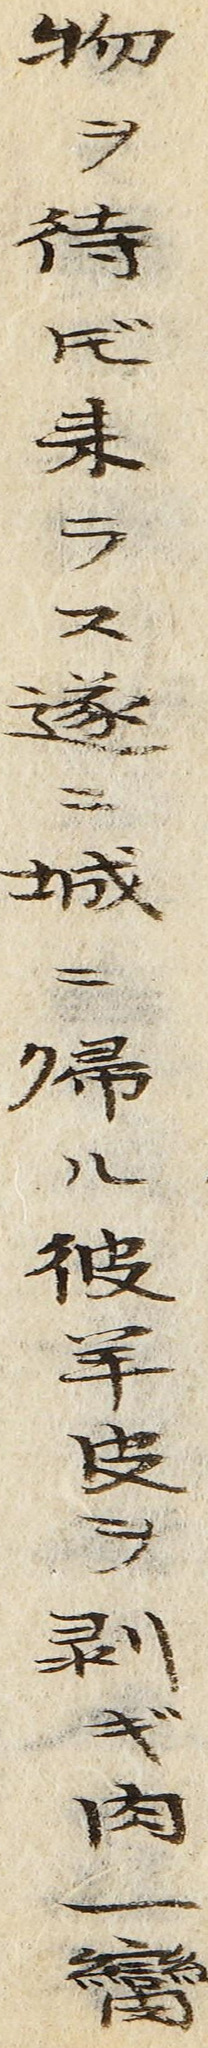物ヲ待ドモ来ラス遂ニ城ニ帰ル彼羊皮ヲ剥ギ肉一臠
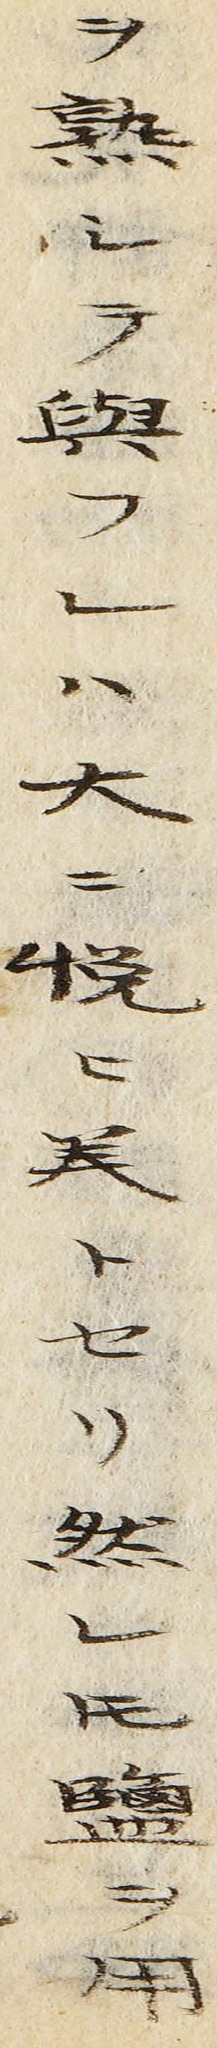ヲ熟シテ与フレハ大ニ悦ヒ美トセリ然レトモ塩ヲ用
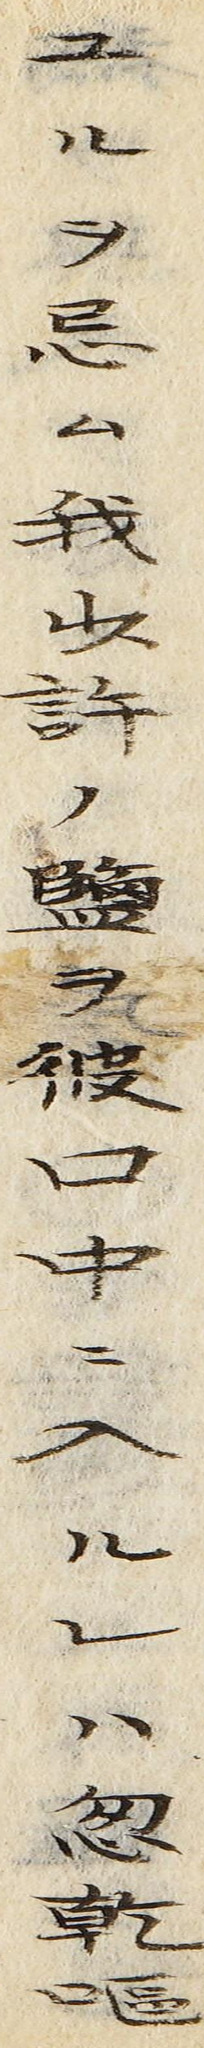ユルヲ忌ム我少許ノ塩ヲ彼口中ニ入ルレハ忽乾呕
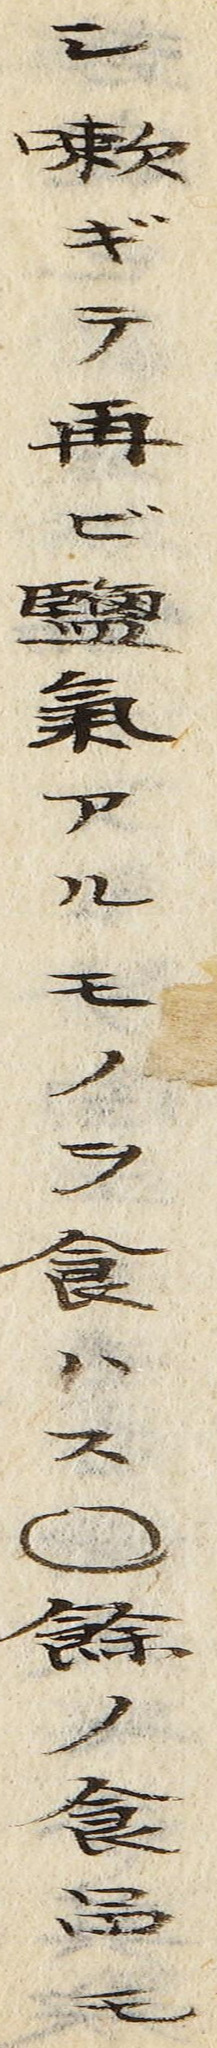シ嗽ギテ再塩気アルモノヲ食ハス◯余ノ食品モ
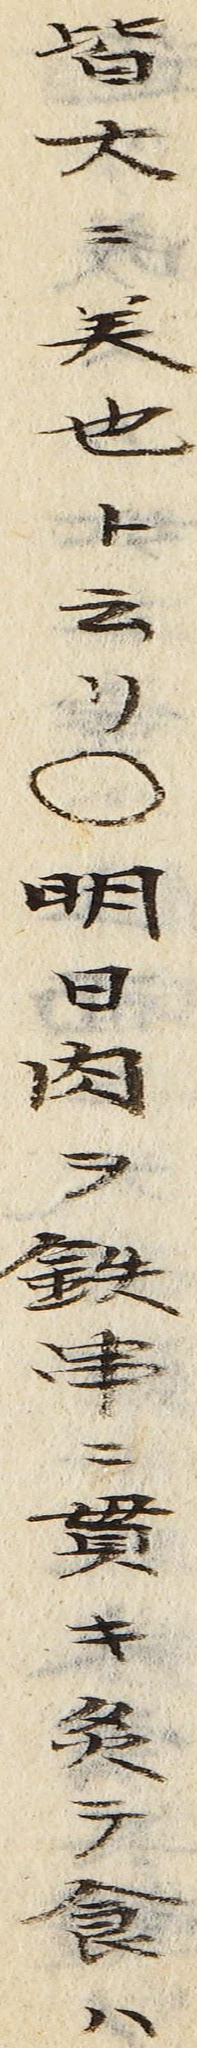皆大ニ美也ト云リ◯明日肉ヲ鉄串ニ貫キ炙テ食ハ
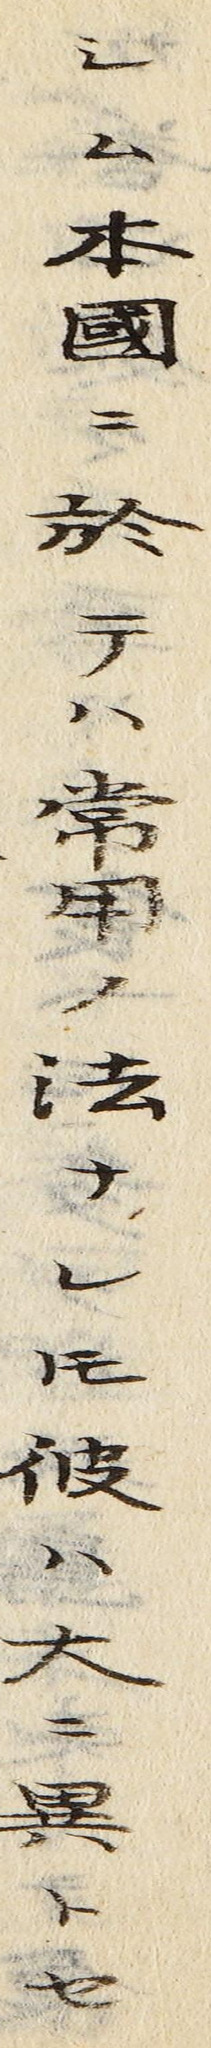シム本国ニ於テハ常用ノ法ナレトモ彼ハ大ニ異トセ
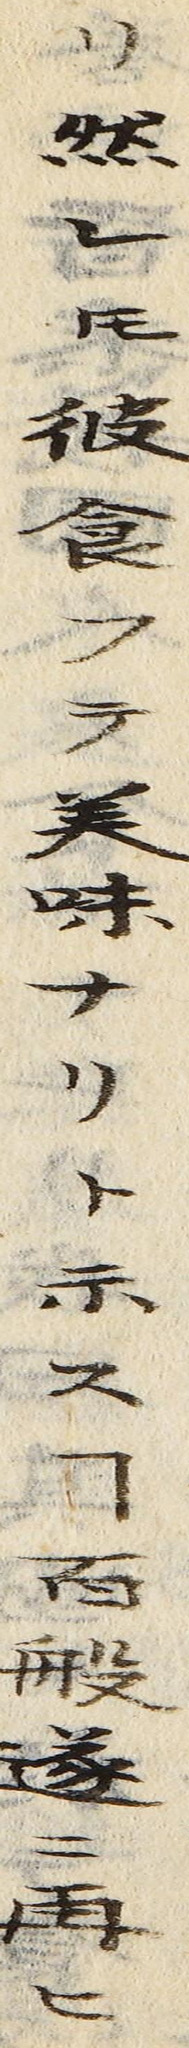リ然レトモ彼食フテ美味ナリト示スコト百般遂ニ再ヒ
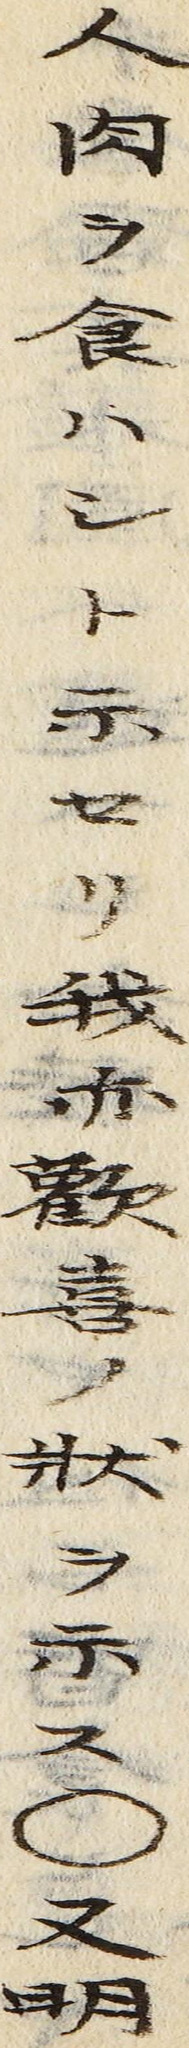人肉ヲ食ハシト示セリ我亦歓喜ノ状ヲ示ス◯又明
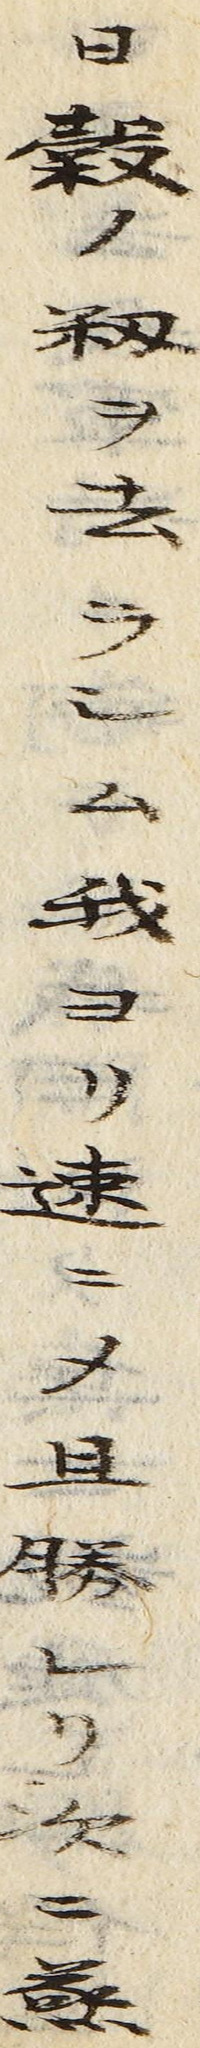日穀ノ籾ヲ去ラシム我ヨリ速ニシテ且勝レリ次ニ蒸
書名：漂流紀事
